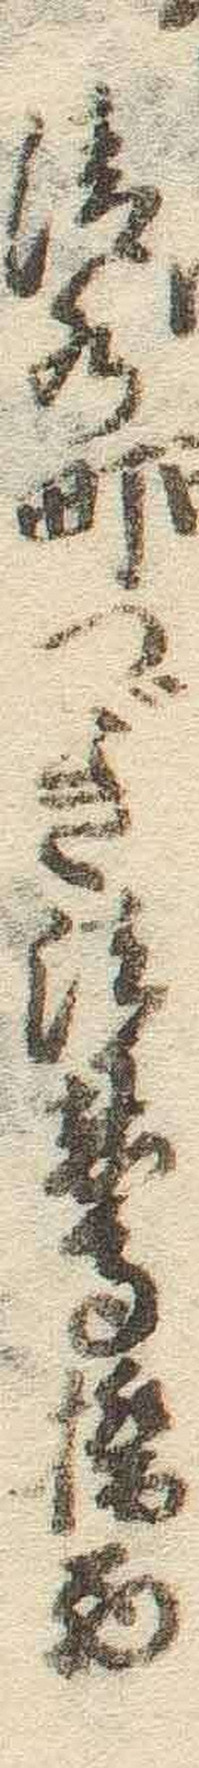清水町つゞき法恩寺橋西
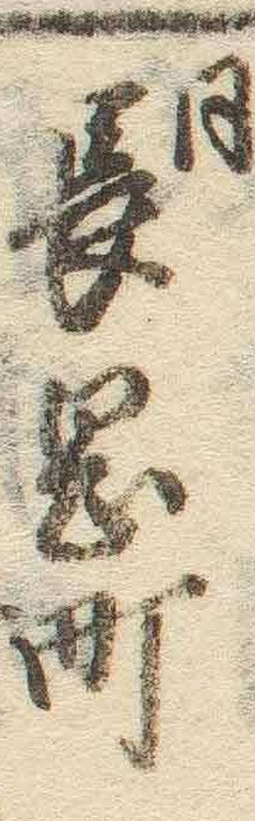長岡町
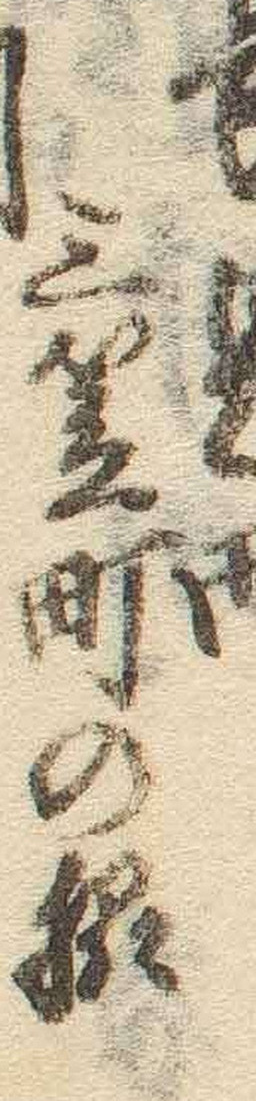三笠町の脇
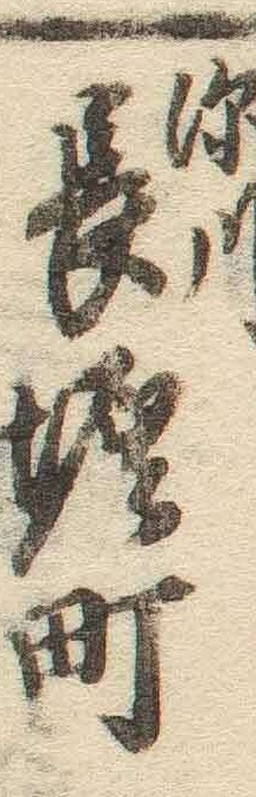長崎町
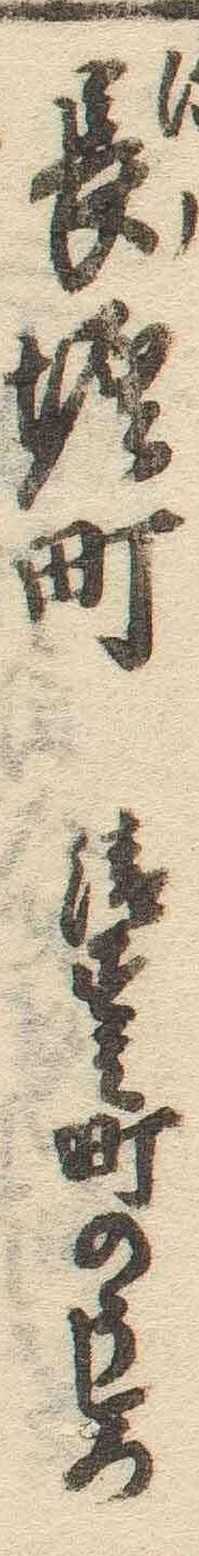長堀町清すみ町のうしろ
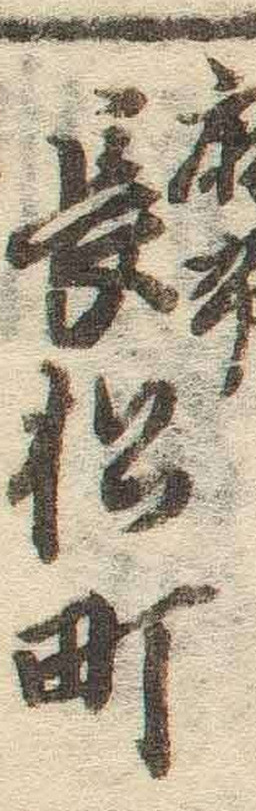長崎町
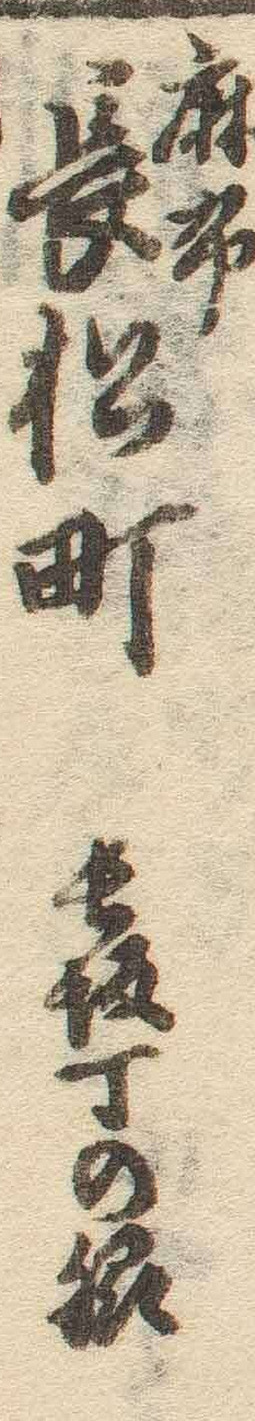長松町長坂丁の脇
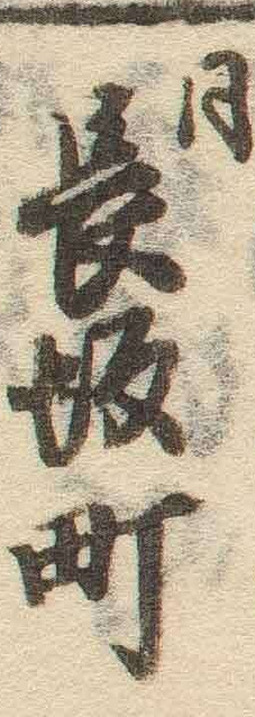長崎町
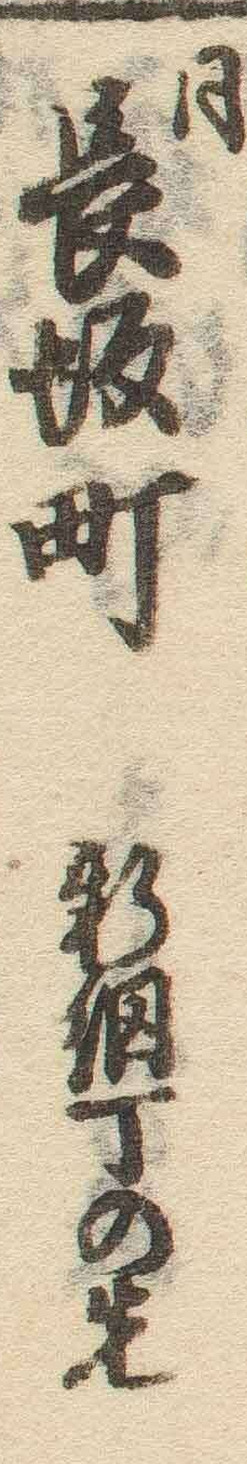長坂町新網丁の先

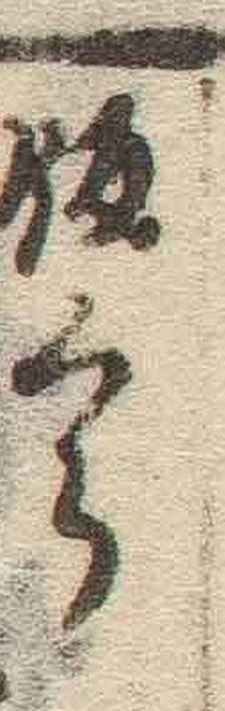飯くら
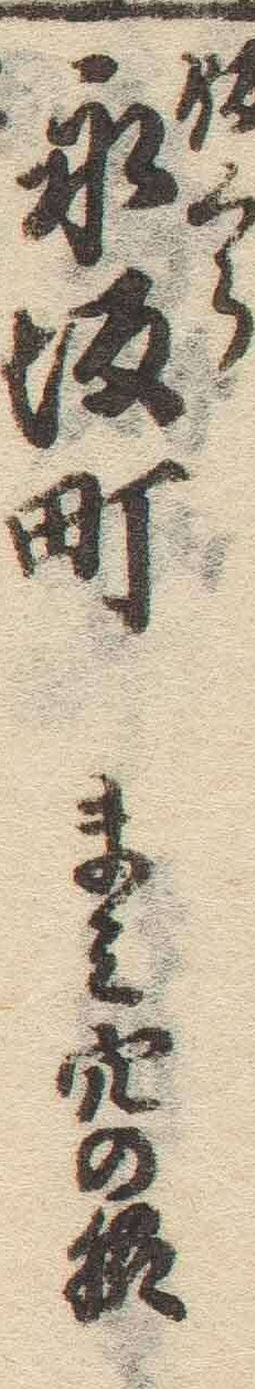永坂町まみ穴の脇
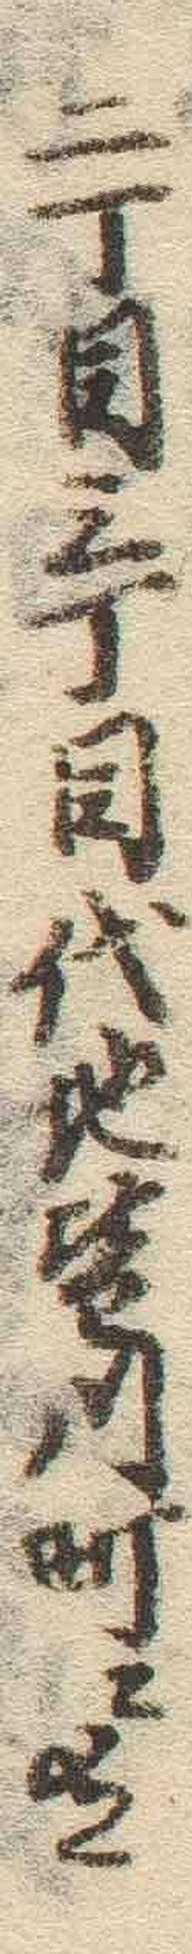二丁目三丁目代地皆川町に有
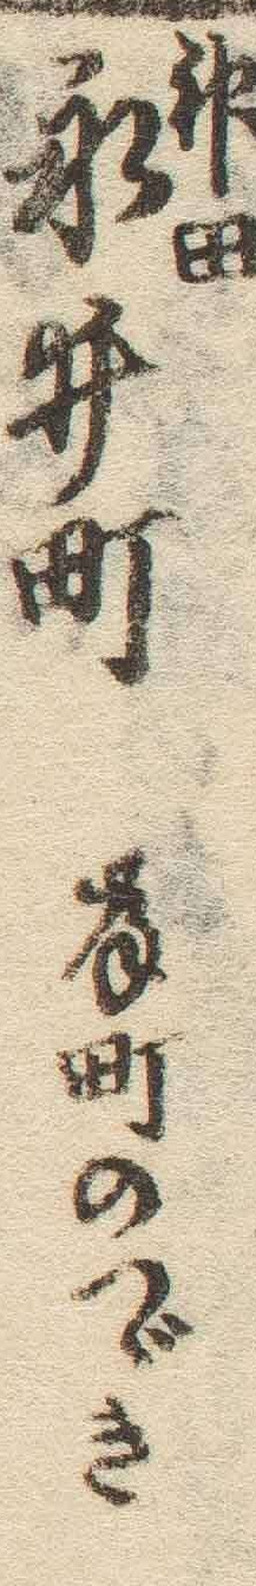永井町岸町のつゞき
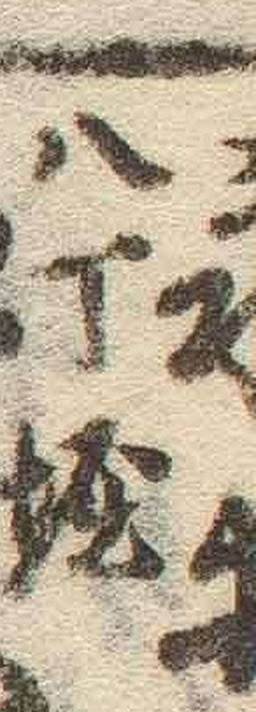八丁堀
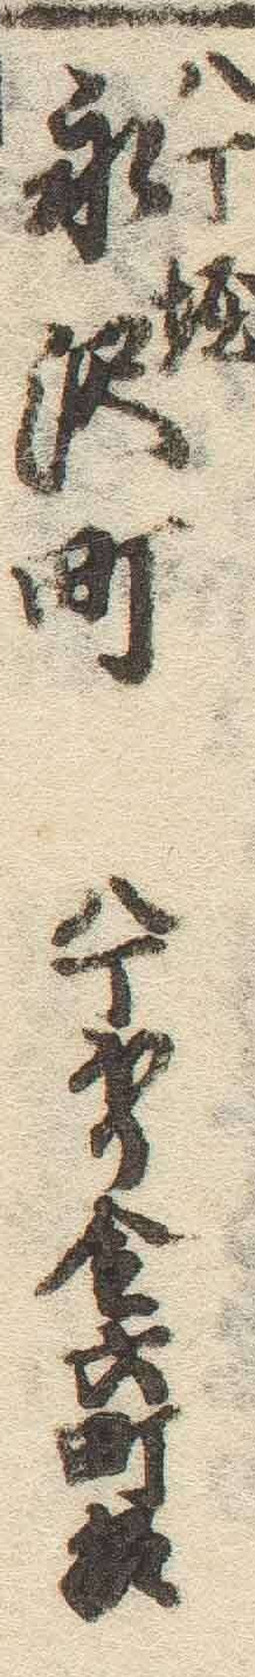永沢町八丁ほり金六町脇
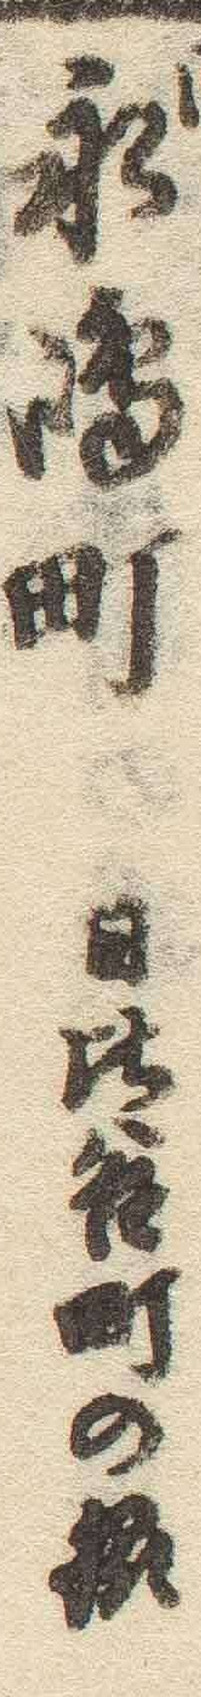永島町日比谷町の脇
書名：江戸町独案内
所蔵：東京学芸大学附属図書館 国文学研究資料館
